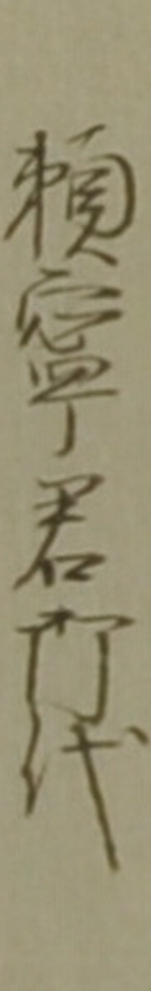頼寧君御代
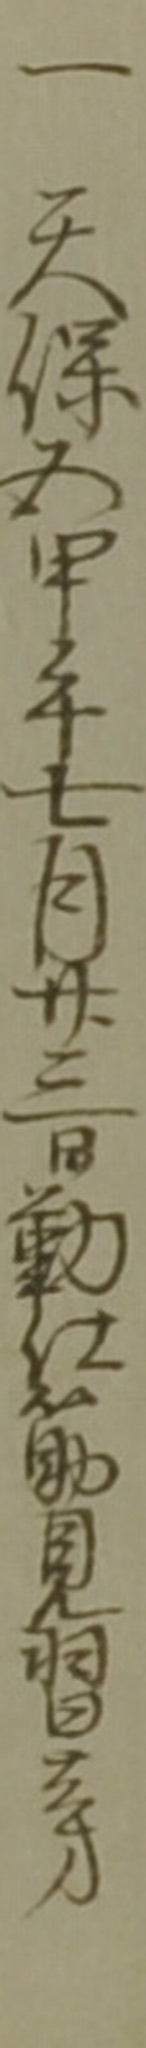一天保五甲午七月廿三日勤仕筋見習旁
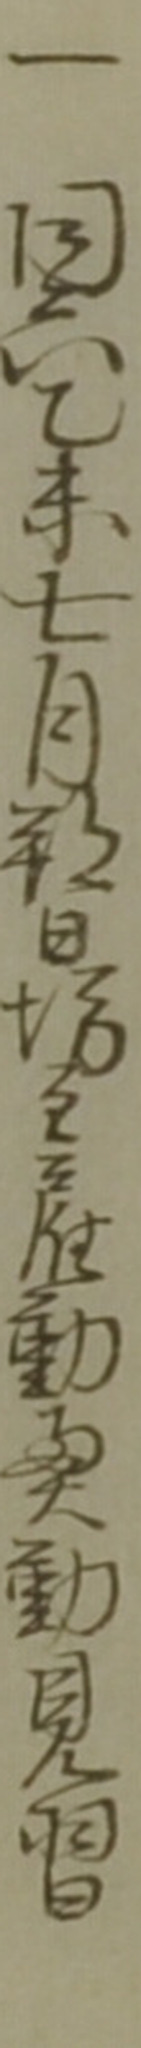一同六乙未七月朔日坊主雇勤奥勤見習
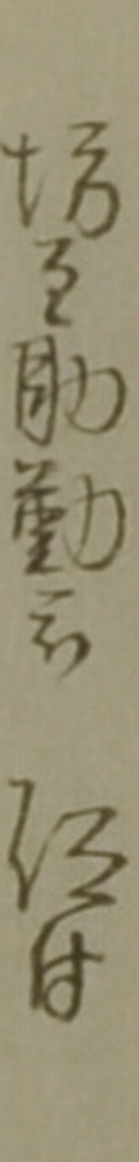坊主助勤被仰付
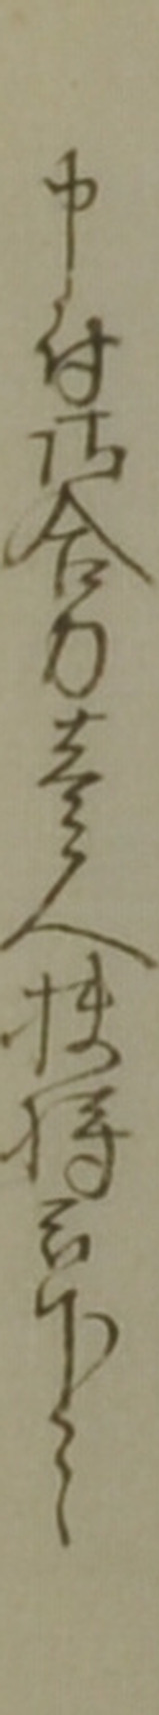申付御合力壱人扶持被下之
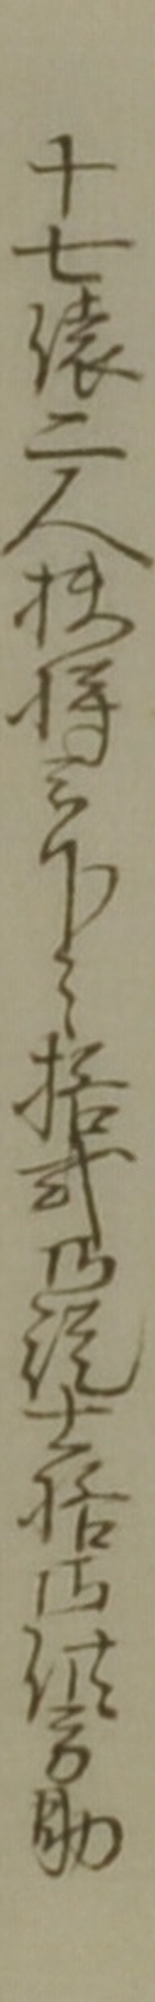十七俵二人扶持被下之格式御徒士格御供方助
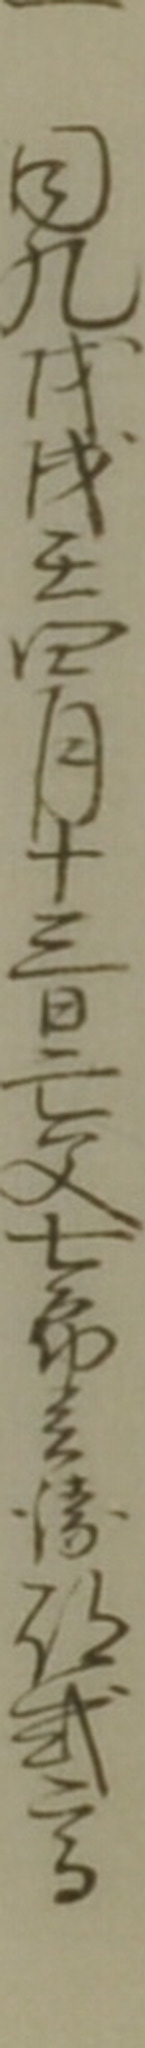一同九戊戌閏四月十三日亡父七郎兵衛跡式高
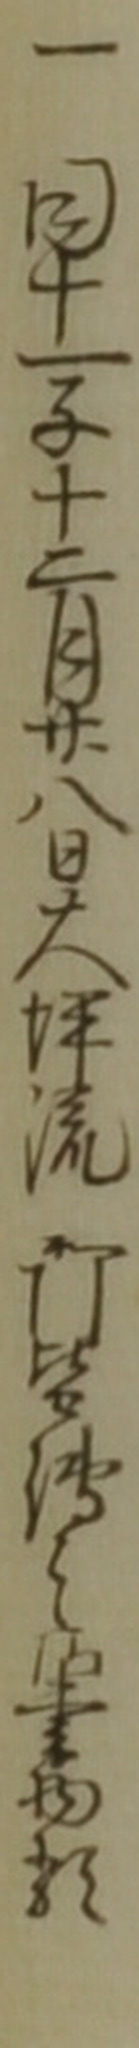一同十一子十二月廿八日大坪流御皆伝之御書物類
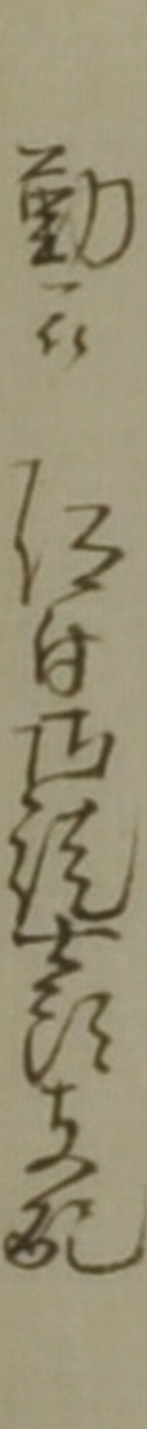勤被仰付御徒士頭支配
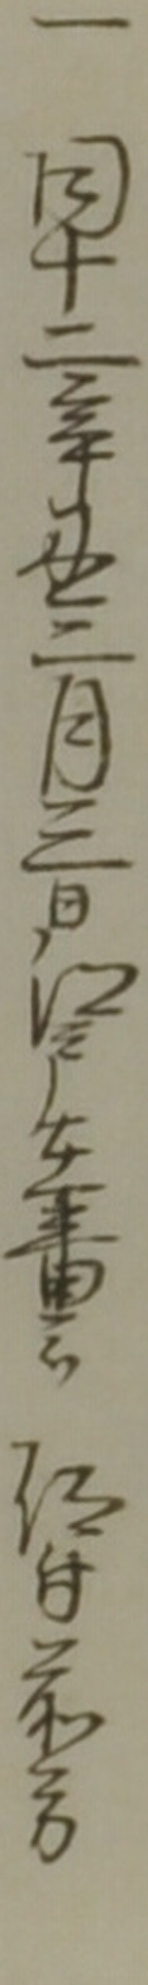一同十二辛丑二月三日江戸在番被仰付前方
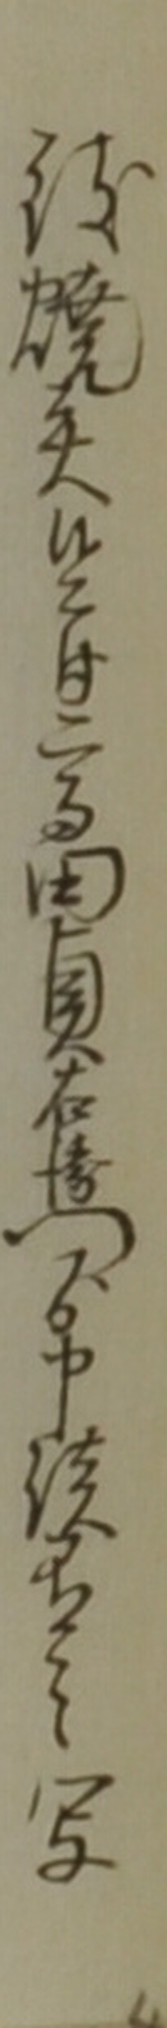致焼失候ニ付高田貞右衛門ゟ申談有之写
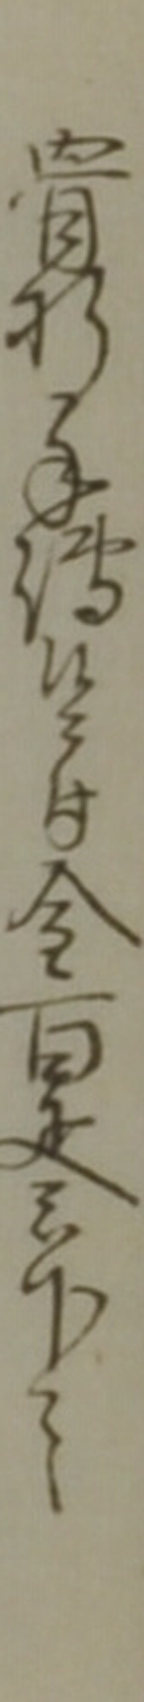骨折手伝候ニ付金百疋被下之
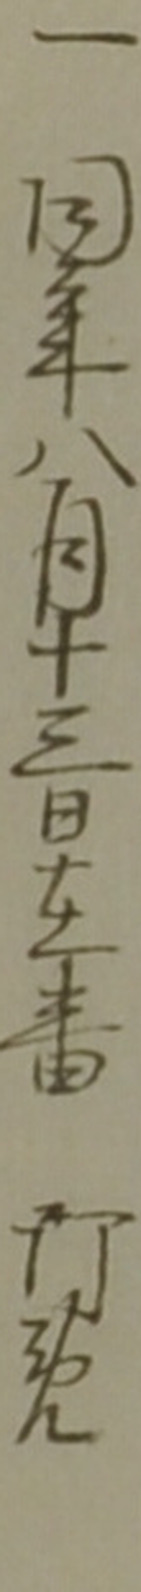一同年八月十三日在番御免
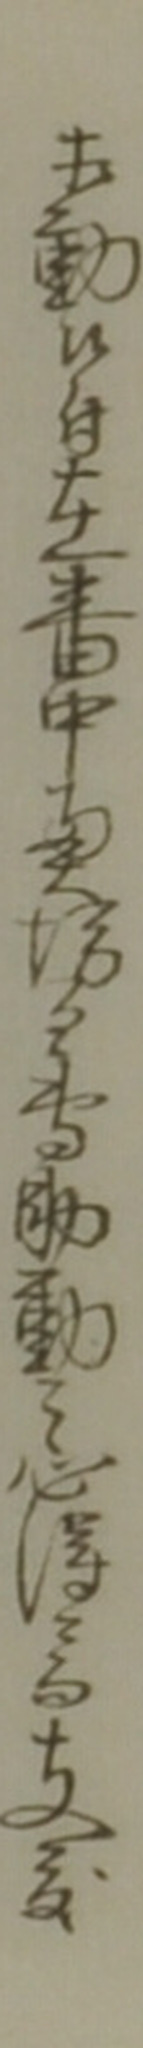相勤候付在番中奥坊主専助勤之心得ニ而支度
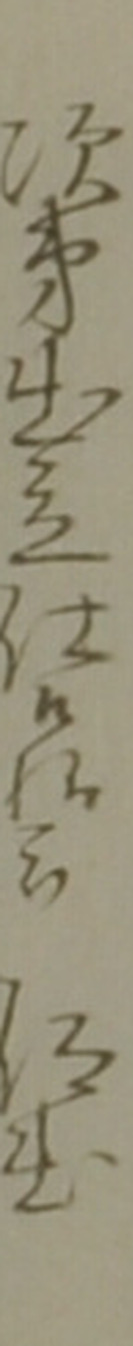次第出立仕候様被仰出
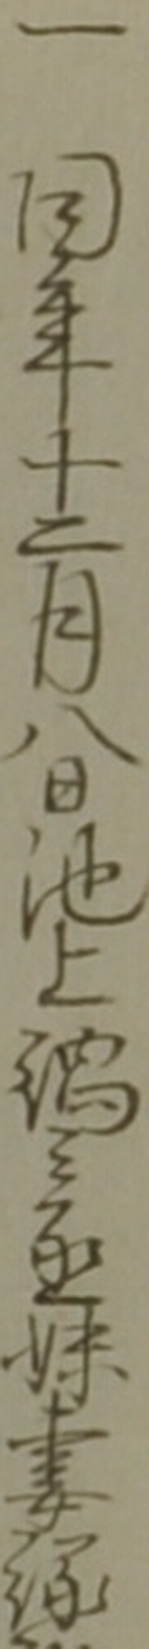一同年十二月八日池上鍋之丞妹妻縁組願済
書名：無足諸士勤仕録（六）
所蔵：伊那市立高遠町図書館・合同会社AMANE
